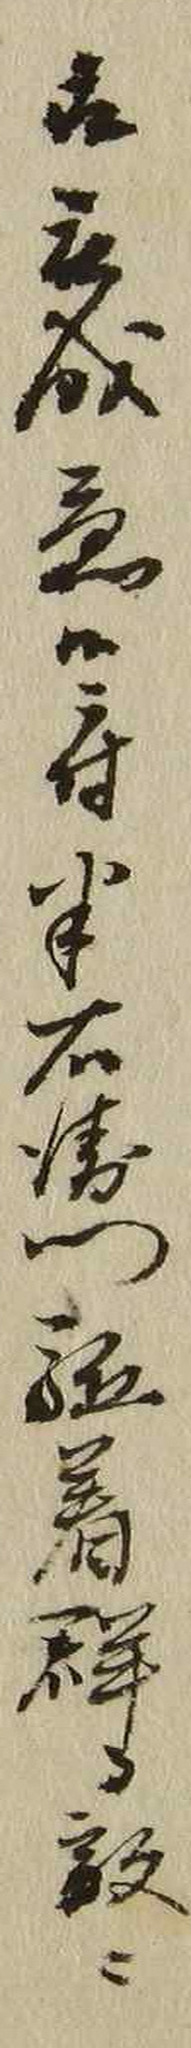取被成兼候ニ付半右衛門駆着群る敵ニ
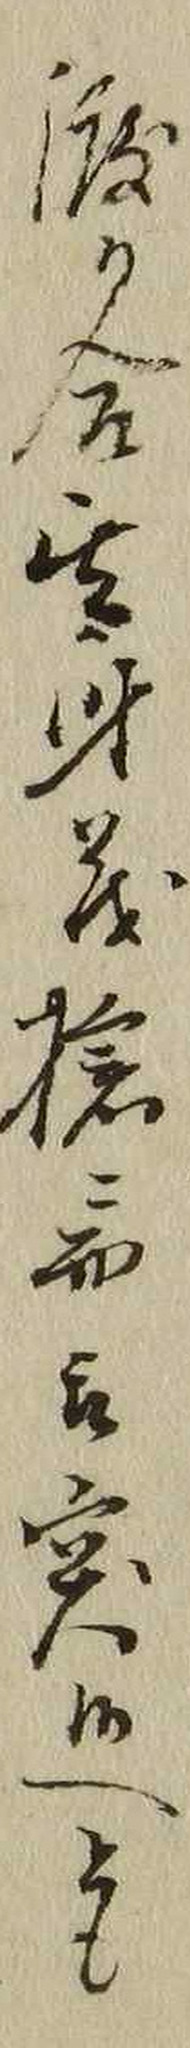渡り合其身茂槍ニ而被突候へとも
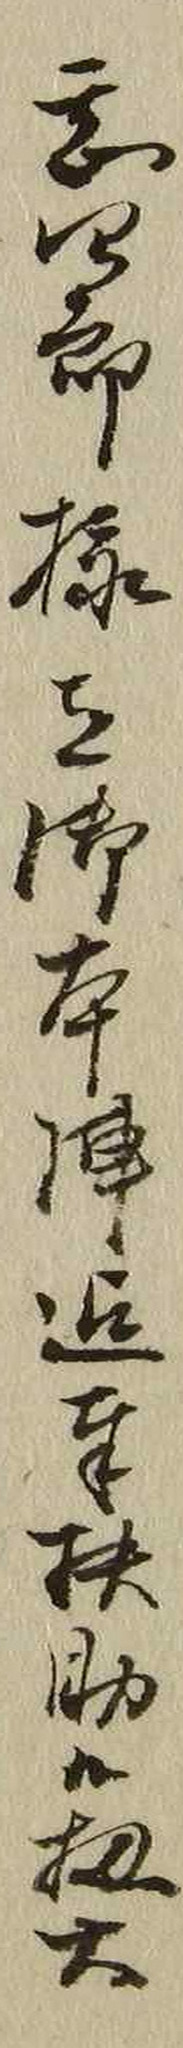甚四郎様之御本陣迄奉扶助候扨大
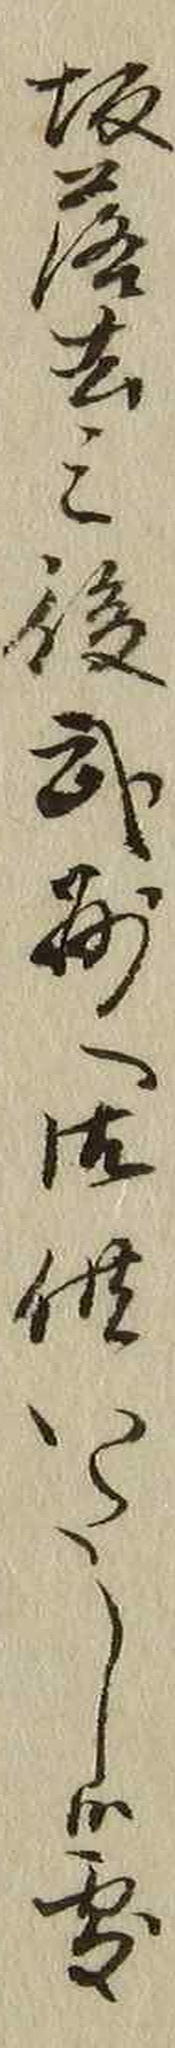坂落去之後武州へ御供いたし候処
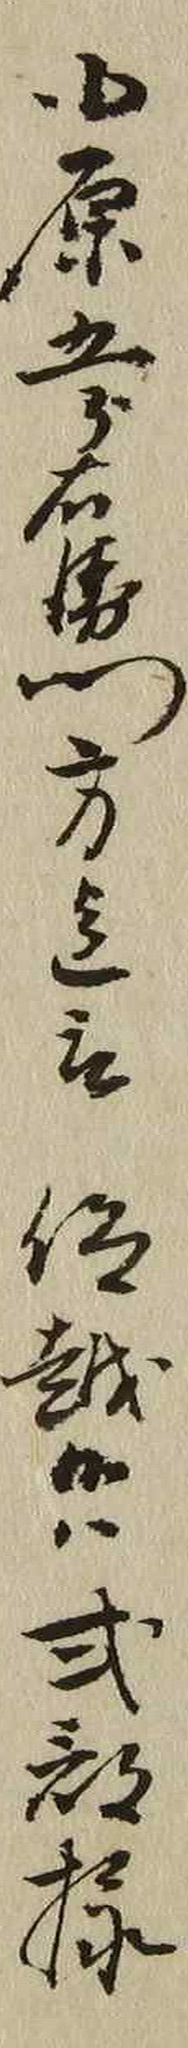小原五郎右衛門方迄被仰越候ハ式部様
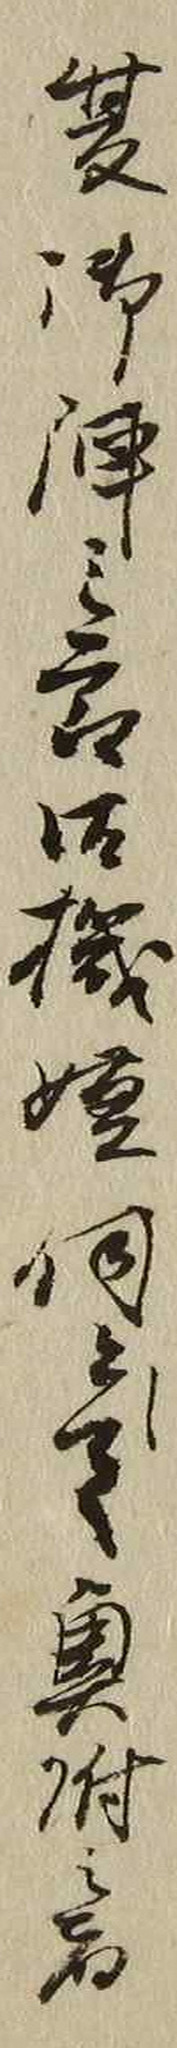夏御陣之節御機嫌伺とて奥附之者
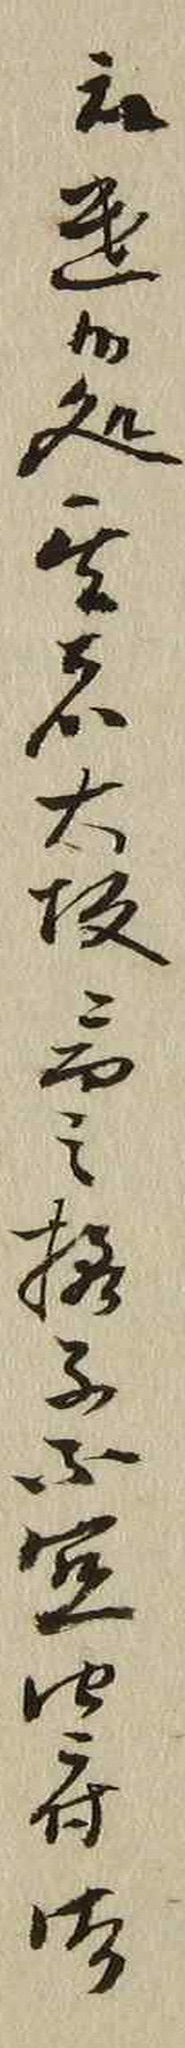被遣候処其者大坂ニ而之様子不宜由ニ付御
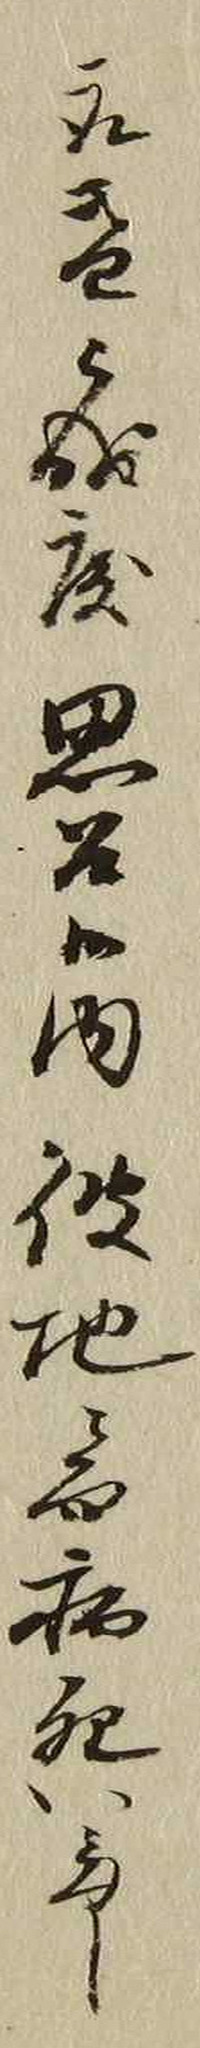取替被成度思召候内彼地ニ而病死いたし
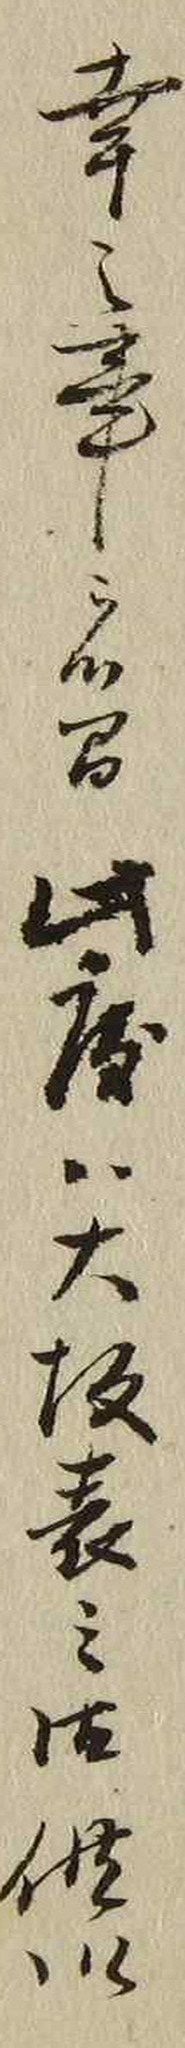幸之事ニ候間此度ハ大坂表之御供い
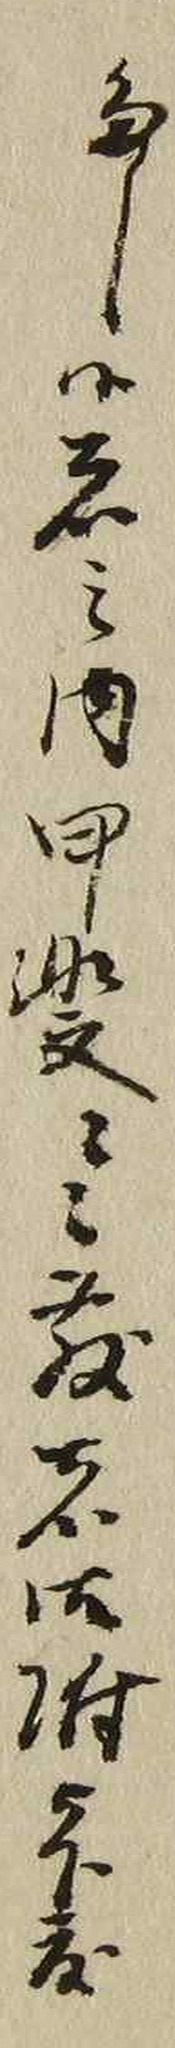たし候者之内甲斐々々敷者御附被下度
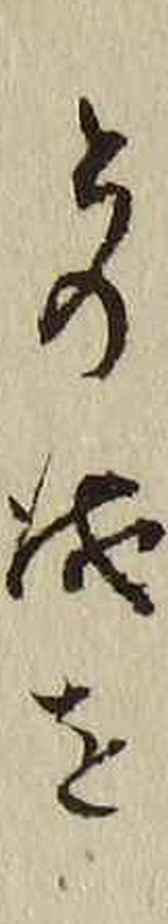との儀を
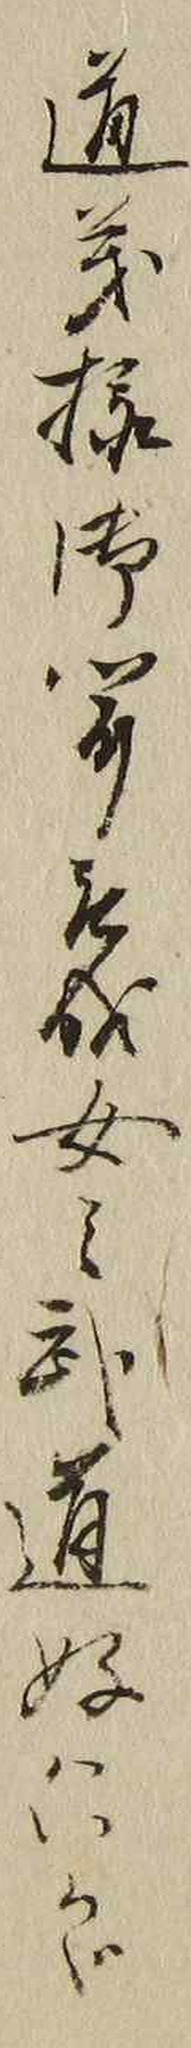道義様御聞被成女之武道好ハいかゞ
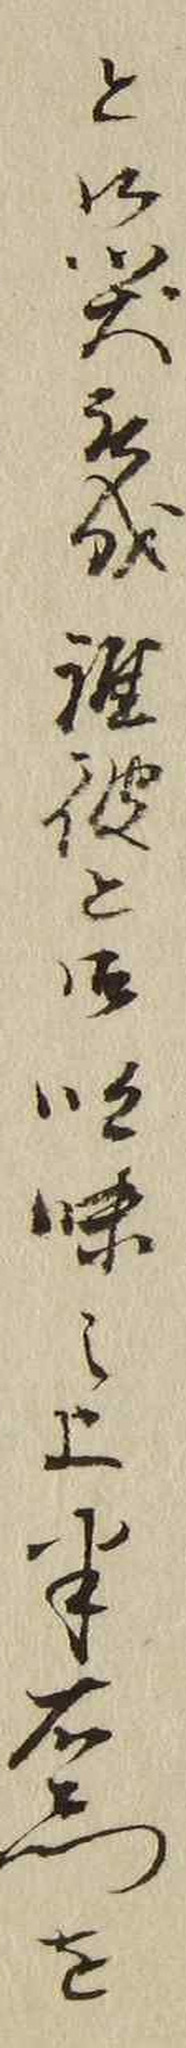と御笑被成誰彼と御吟味之上半右衛門を
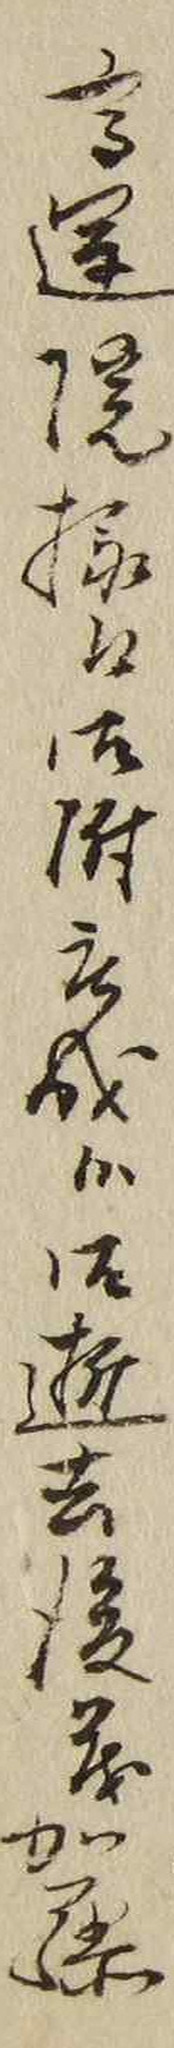高運院様江御附被成候御逝去後茂加藤

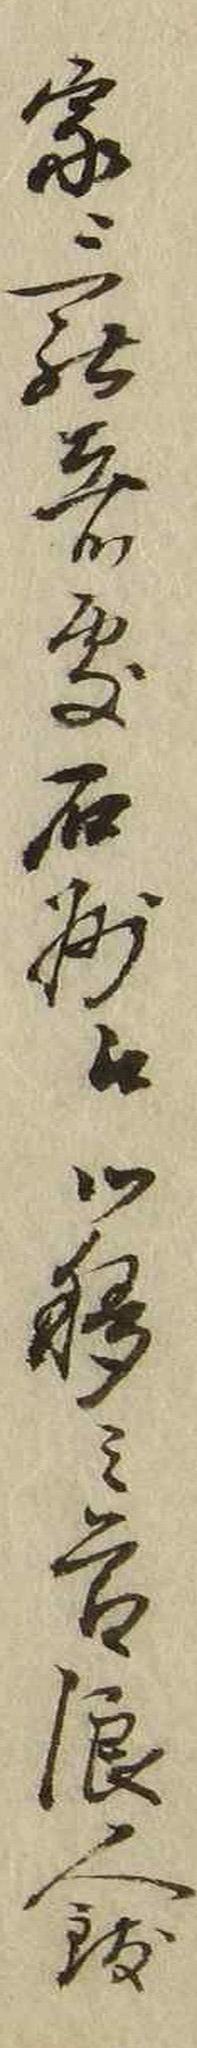家ニ罷在候処石州江御移之節浪人致
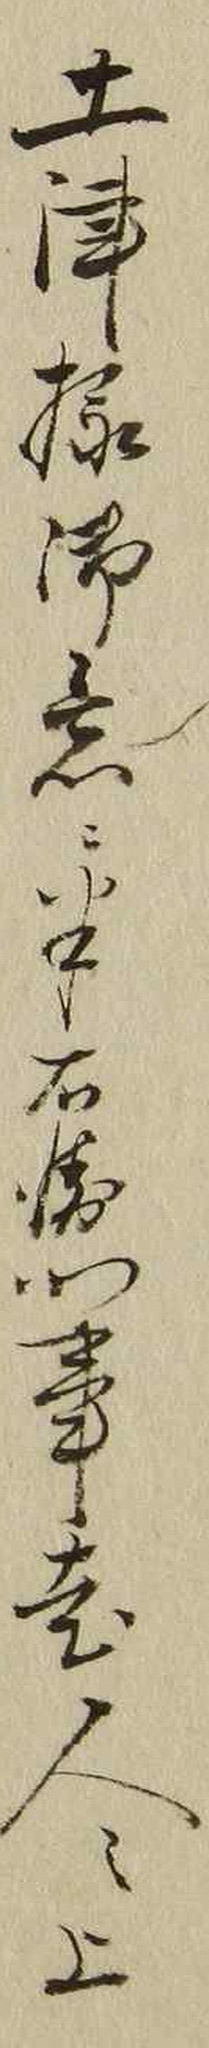土津様御意ニ半右衛門事老人之上
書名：諸士系譜　巻之359　す之部9
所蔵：会津若松市立会津図書館
